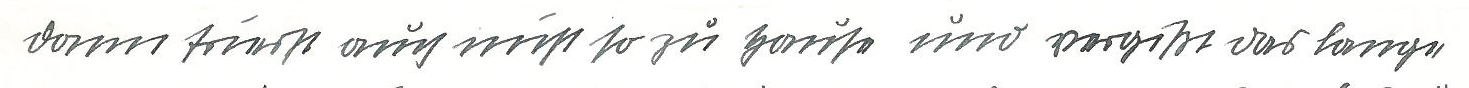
dann frierst auch nicht so zu Hause und vergißt das lange
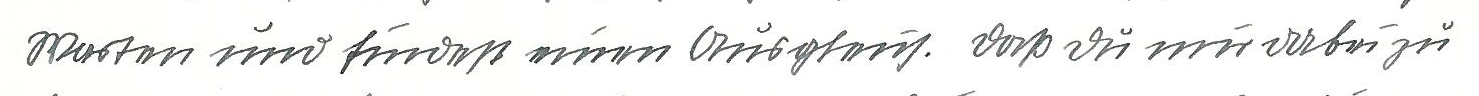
Warten und findest einen Ausgleich. Daß Du mir dabei zu
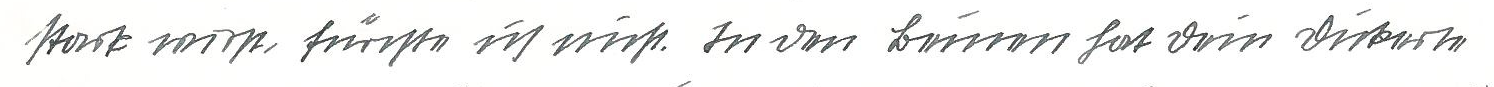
stark wirst, fürchte ich nicht. In den Beinen hat Dein Dickerle
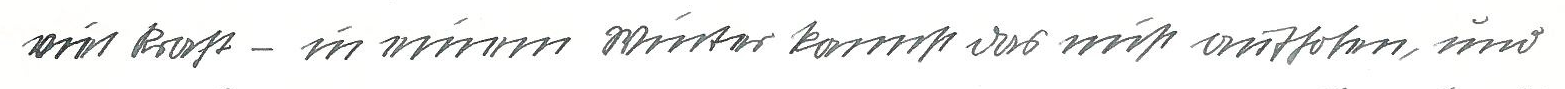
viel Kraft – in einem Winter kannst das nicht aufholen, und
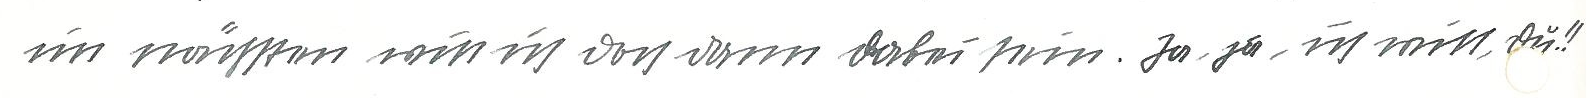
im nächsten will ich doch dann dabei sein. Ja, ja, ich will, Du!!
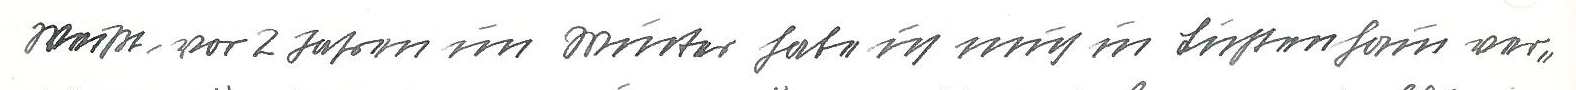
Weißt, vor 2 Jahren im Winter habe ich mich in L. ver¬
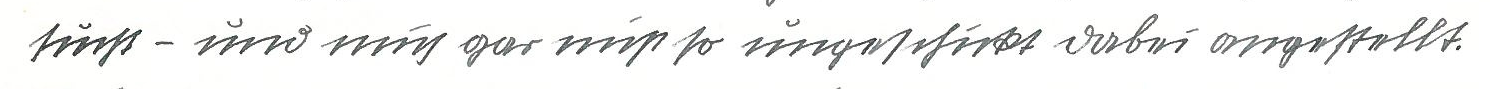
sucht – und mich gar nicht so ungeschickt dabei angestellt.
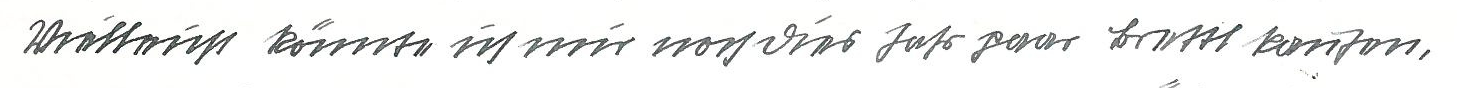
Vielleicht könnte ich mir noch dies Jahr paar Brettl kaufen,
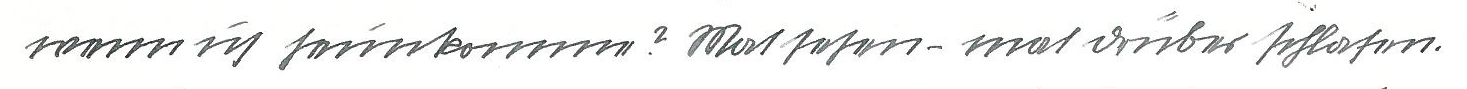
wenn ich heimkomme? Mal sehen – mal drüber schlafen.
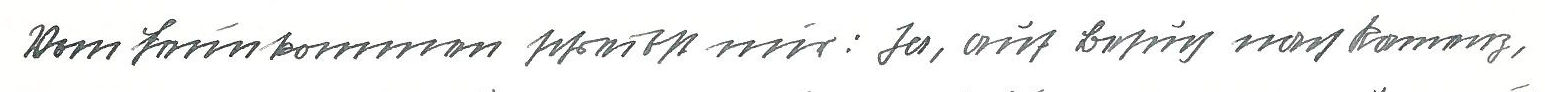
Vom Heimkommen schreibst mir: Ja, auf Besuch nach K.,
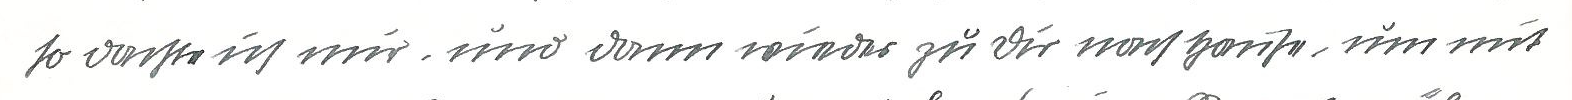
so dachte ich mir, und dann wieder zu Dir nach Hause, um mit
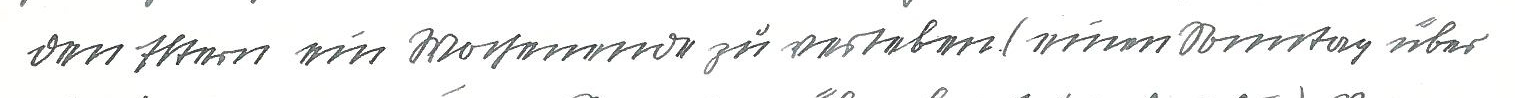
den Eltern ein Wochenende zu verleben (einen Sonntag über
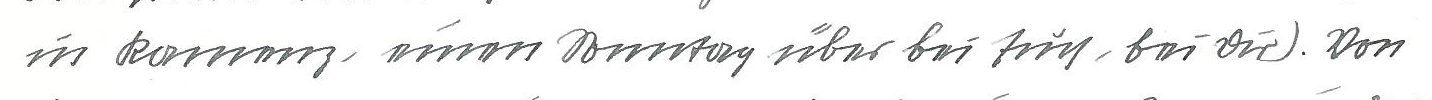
in K., einen Sonntag über bei Euch, bei Dir). Von
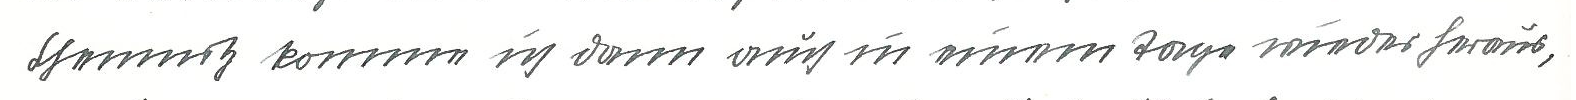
Chemnitz komme ich dann auch in einem Tage wieder heraus,
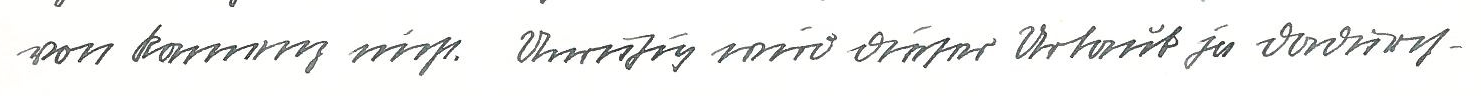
von K. nicht. Unruhig wird dieser Urlaub ja dadurch –
